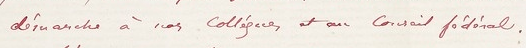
démarche à nos collègues et au Conseil fédéral.
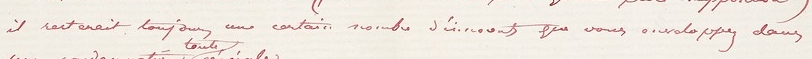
il resterait toujours un certain nombre d'innocents que vous enveloppez dans
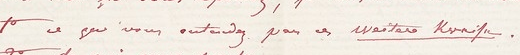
1o ce que vous entendez par ces Weitere Kreise.
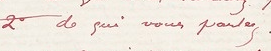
2o de qui vous parlez.
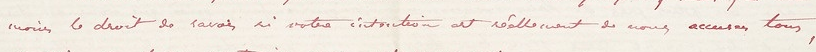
moins le droit de savoir si votre intention est réellement de nous accuser tous,
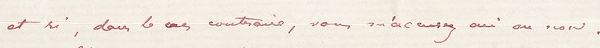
et si, dans le cas contraire, vous m'accusez oui ou non.
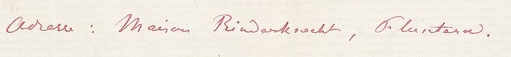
Adresse: Maison Rinderknecht, Fluntern.
